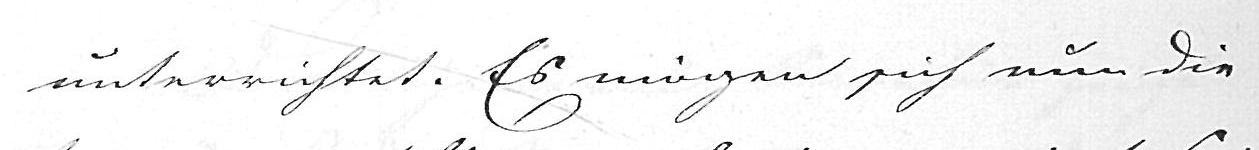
unterrichtet. Es mögen sich nun die
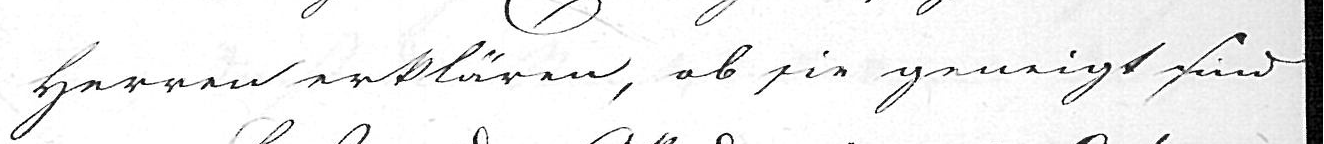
Herren erklären, ob sie geneigt sind
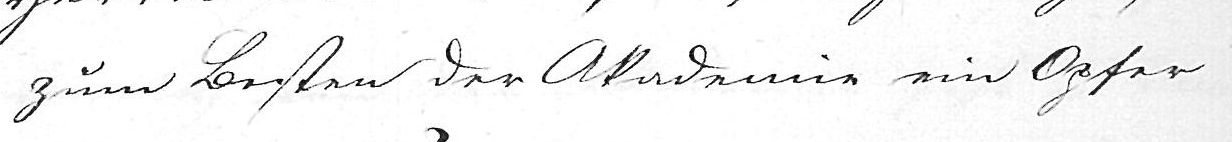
zum Besten der Akademie ein Opfer
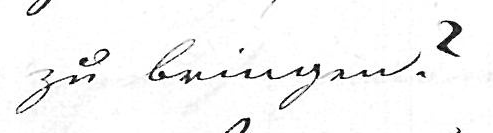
zu bringen?
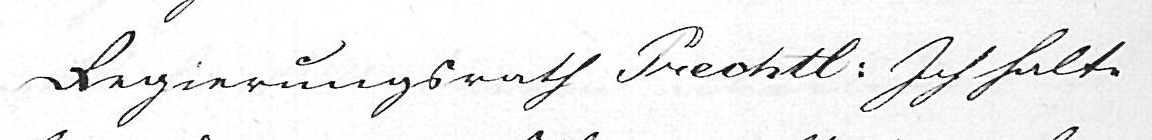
Regierungsrath Prechtl: Ich halte
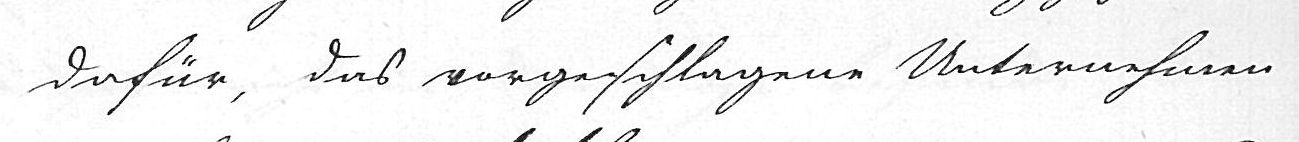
dafür, das vorgeschlagene Unternehmen
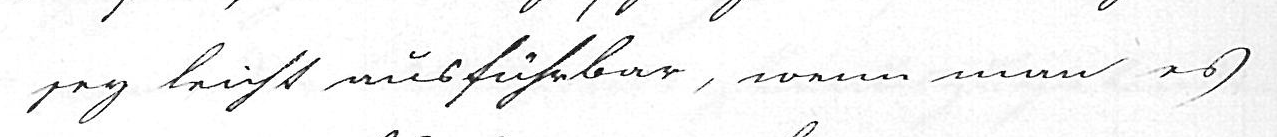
sey leicht ausführbar, wenn man es
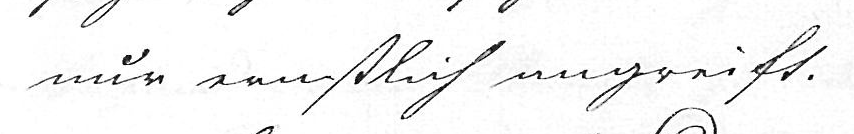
nur ernstlich angreift.
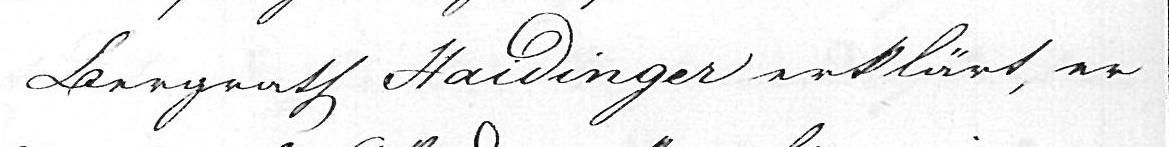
Bergrath Haidinger erklärt, er
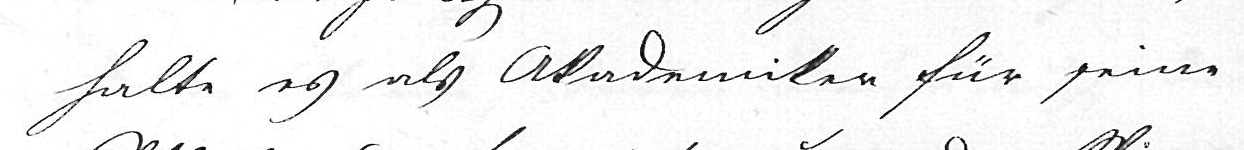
halte es als Akademiker für seine
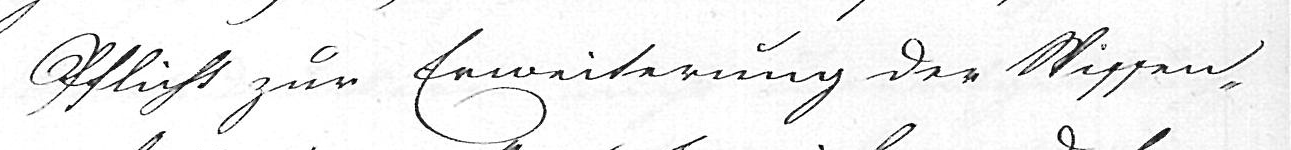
Pflicht zur Erweiterung der Wissen-
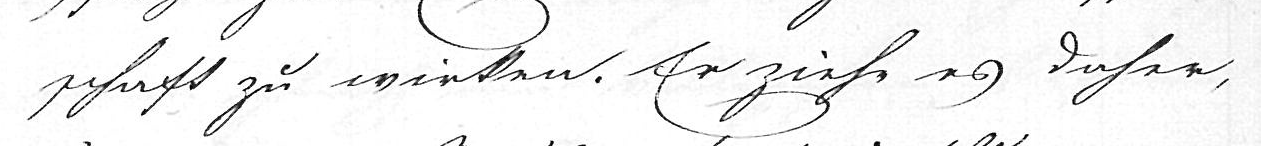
schaft zu wirken. Er ziehe es daher,
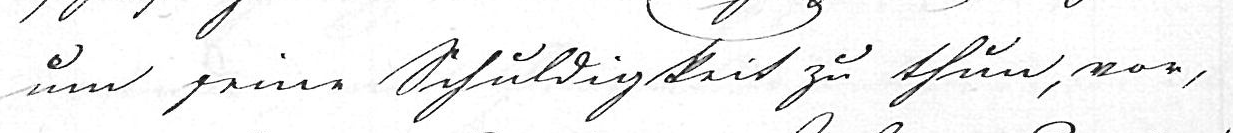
um seine Schuldigkeit zu thun, vor,
